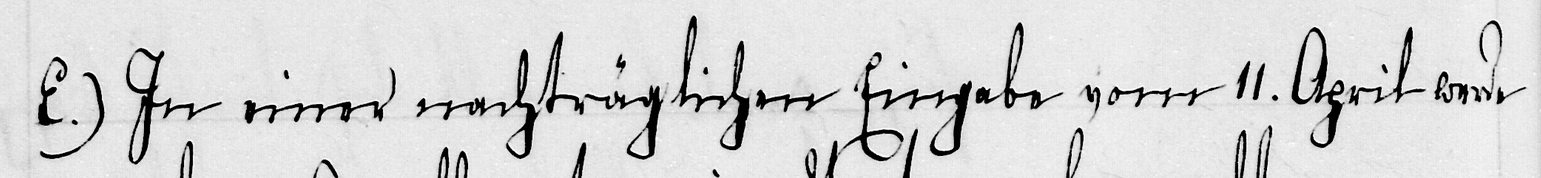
E.) In einer nachträglichen Eingabe vom 11. April werde
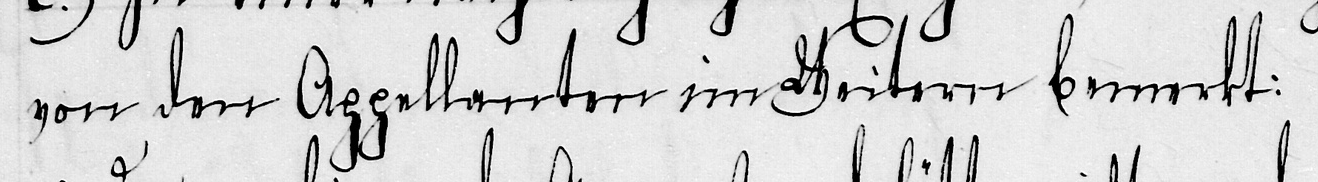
von den Appellanten im Weitern bemerkt:
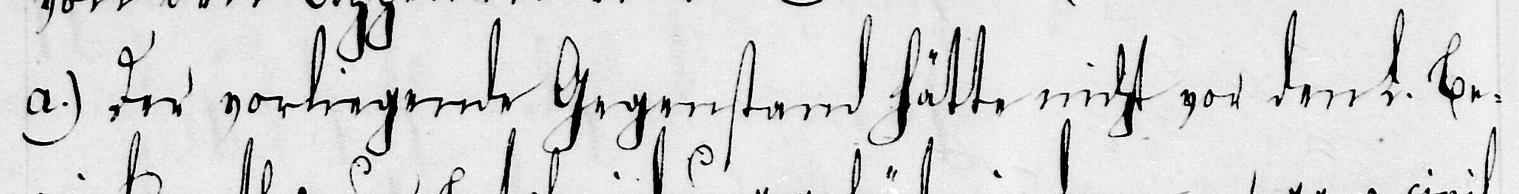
a.) Der vorliegende Gegenstand hätte nicht vor den L. Be¬
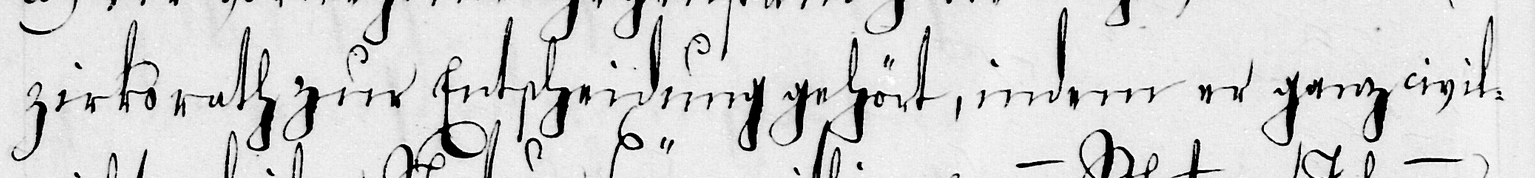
zirksrath zur Entscheidung gehört, indem er ganz civil¬
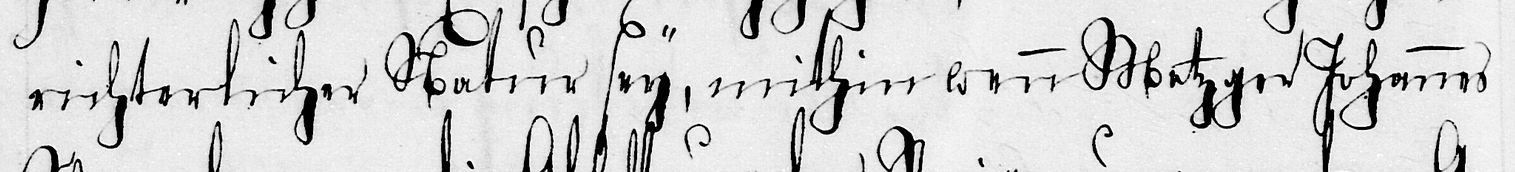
richterlicher Natur sey, mithin wenn Metzger Johannes
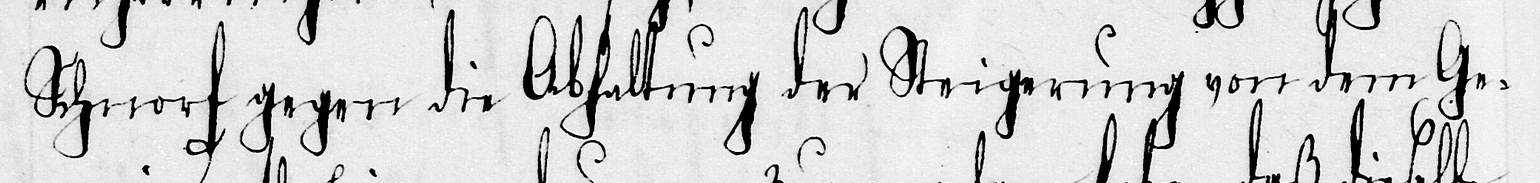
Schnorf gegen die Abhaltung der Steigerung von dem Ge¬
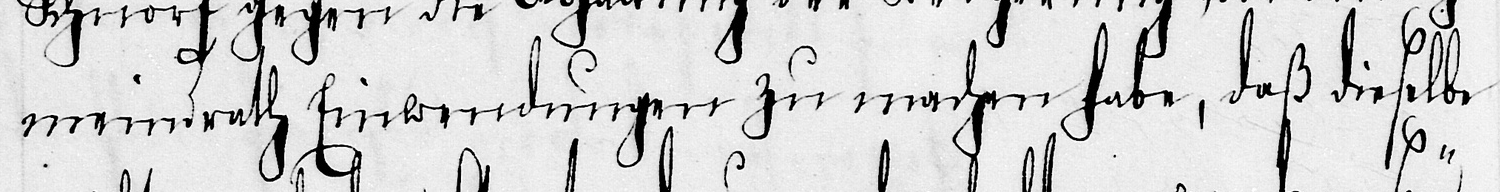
meindrath Einwendungen zu machen habe, daß dieselbe
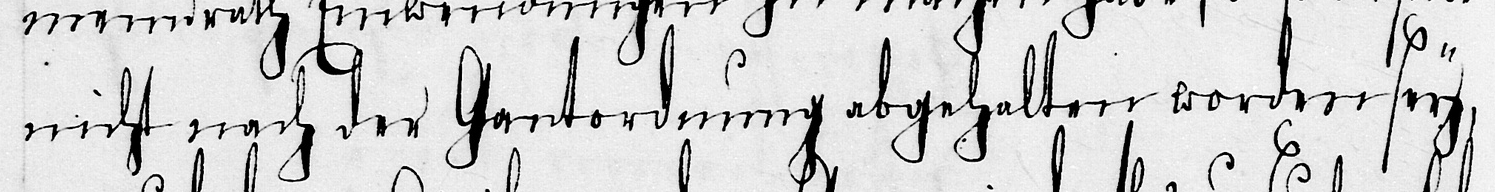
nicht nach der Gantordnung abgehalten worden sey,
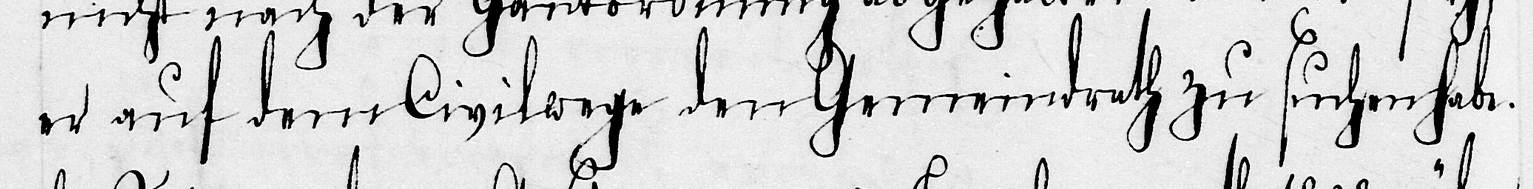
er auf dem Civilwege den Gemeindrath zu suchen habe.
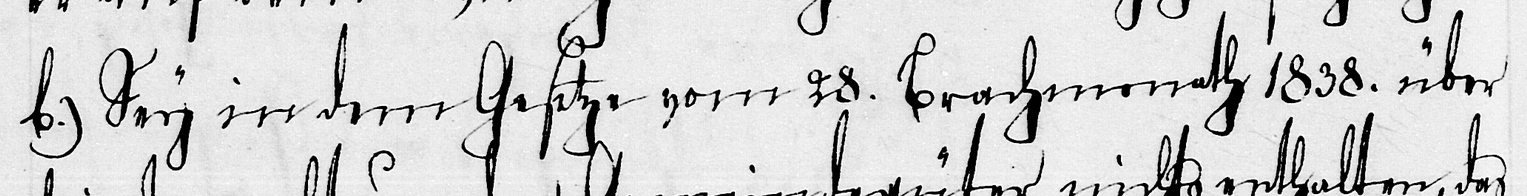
b.) Sey in dem Gesetze vom 28. Brachmonath 1838. über
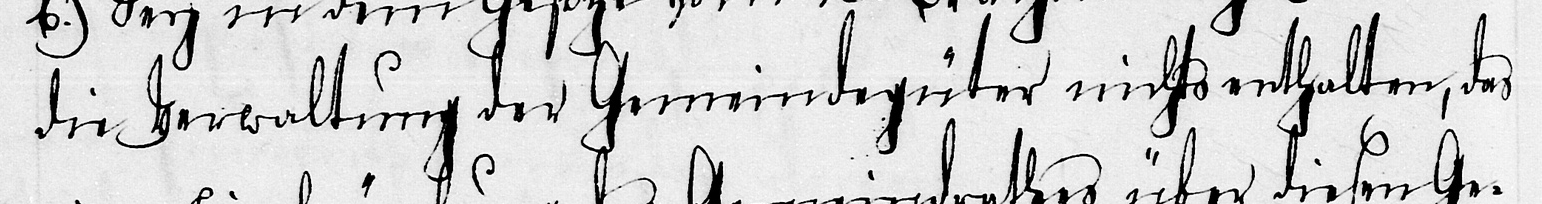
die Verwaltung der Gemeindegüter nichts enthalten, das
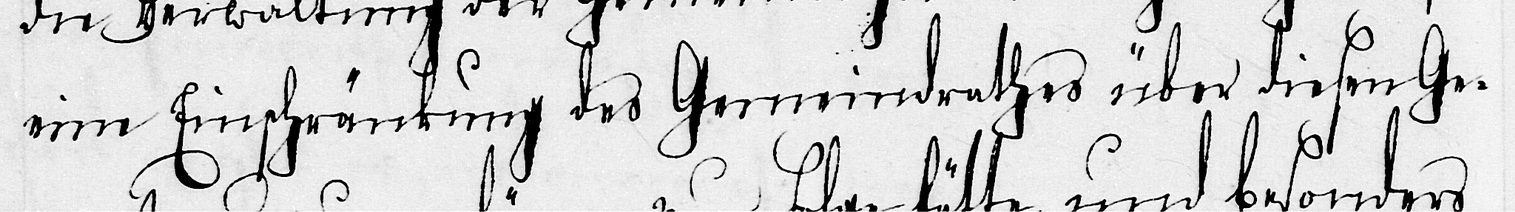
eine Einschränkung des Gemeindrathes über diesen Ge¬
